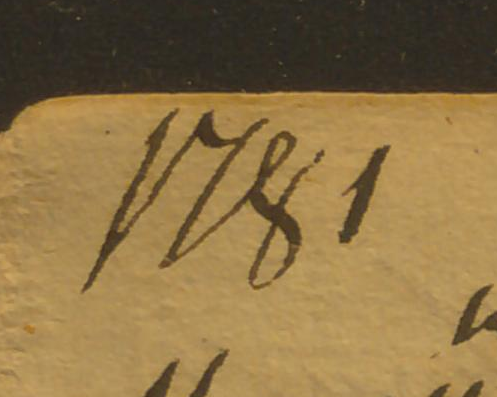1781
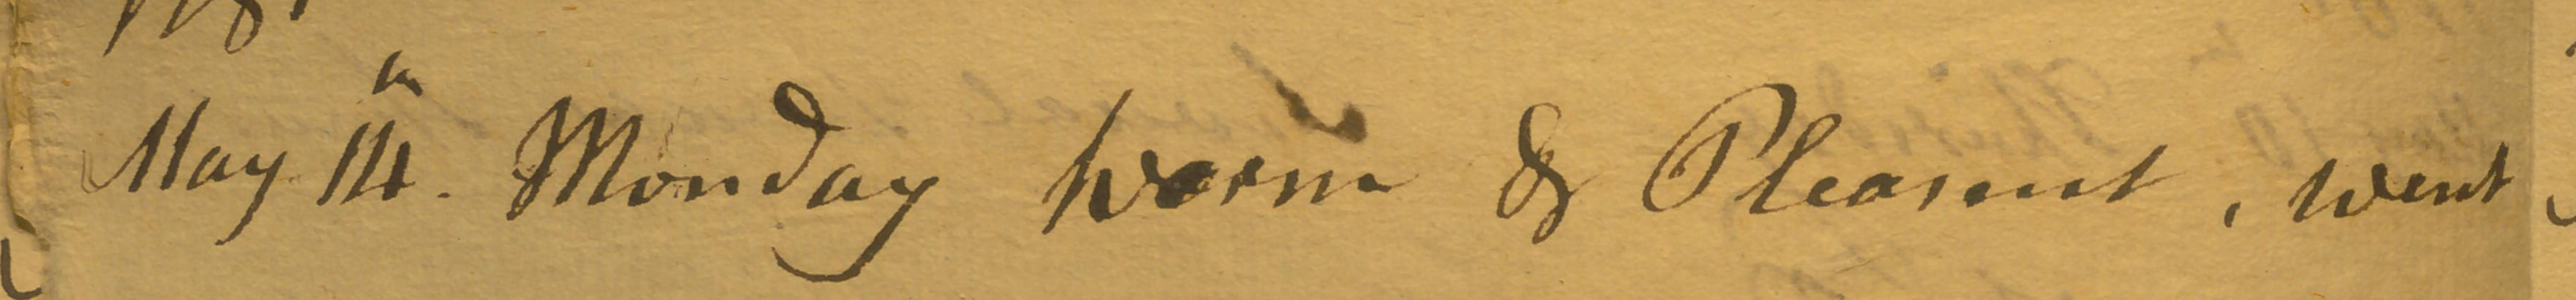May 14^th. Monday warm & Pleasent, went
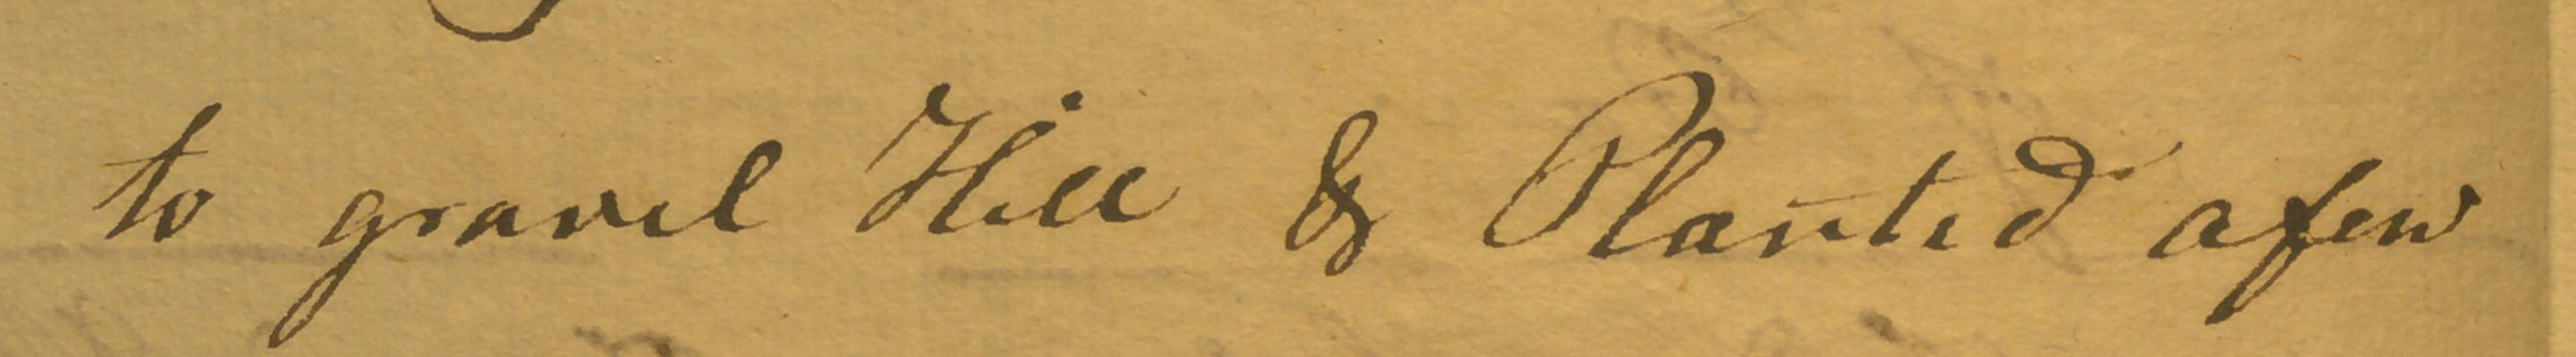to gravel Hill & Planted a few
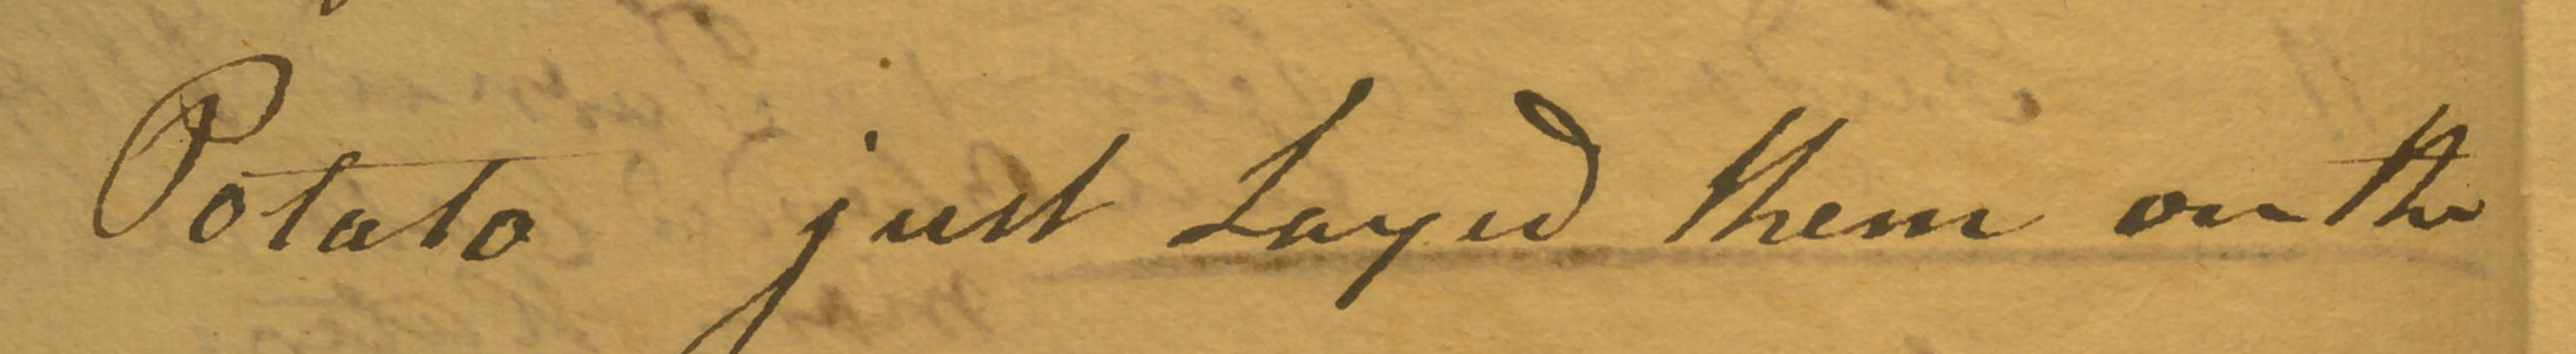Potato just Layed them on the
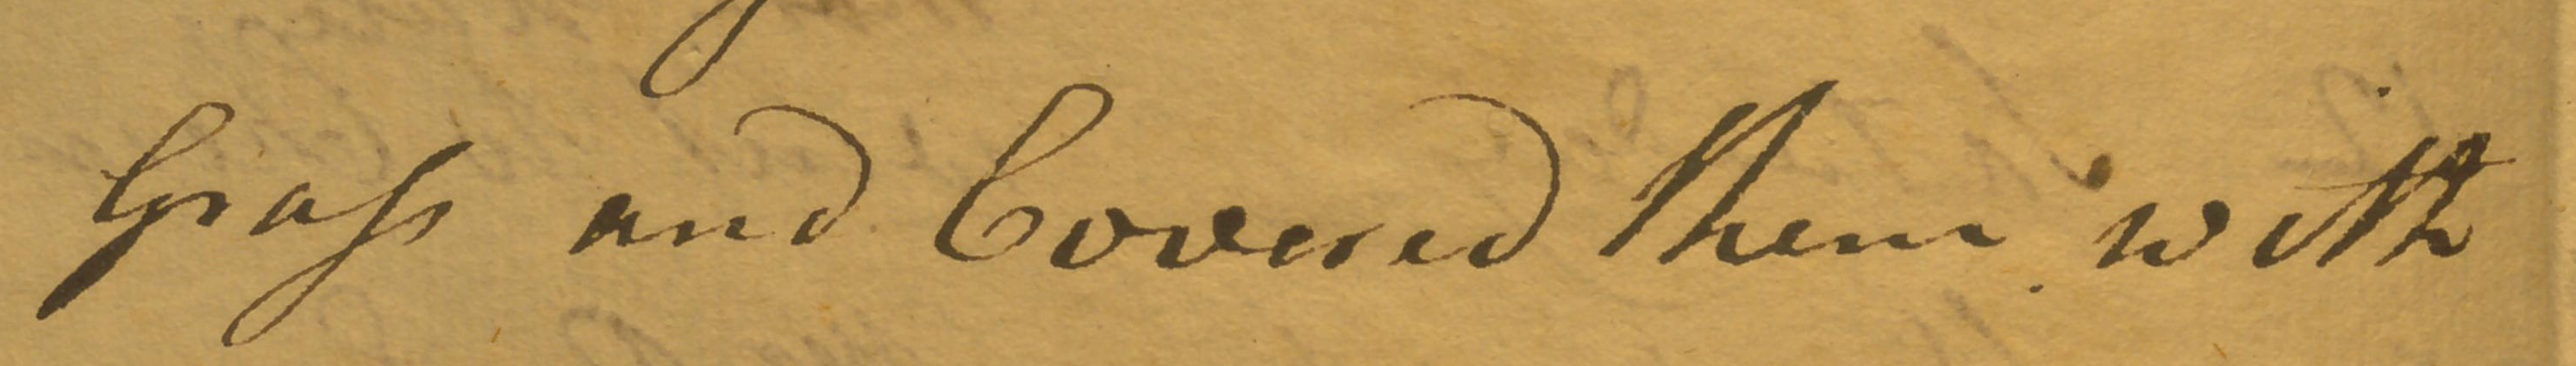Grass and Covered them with
